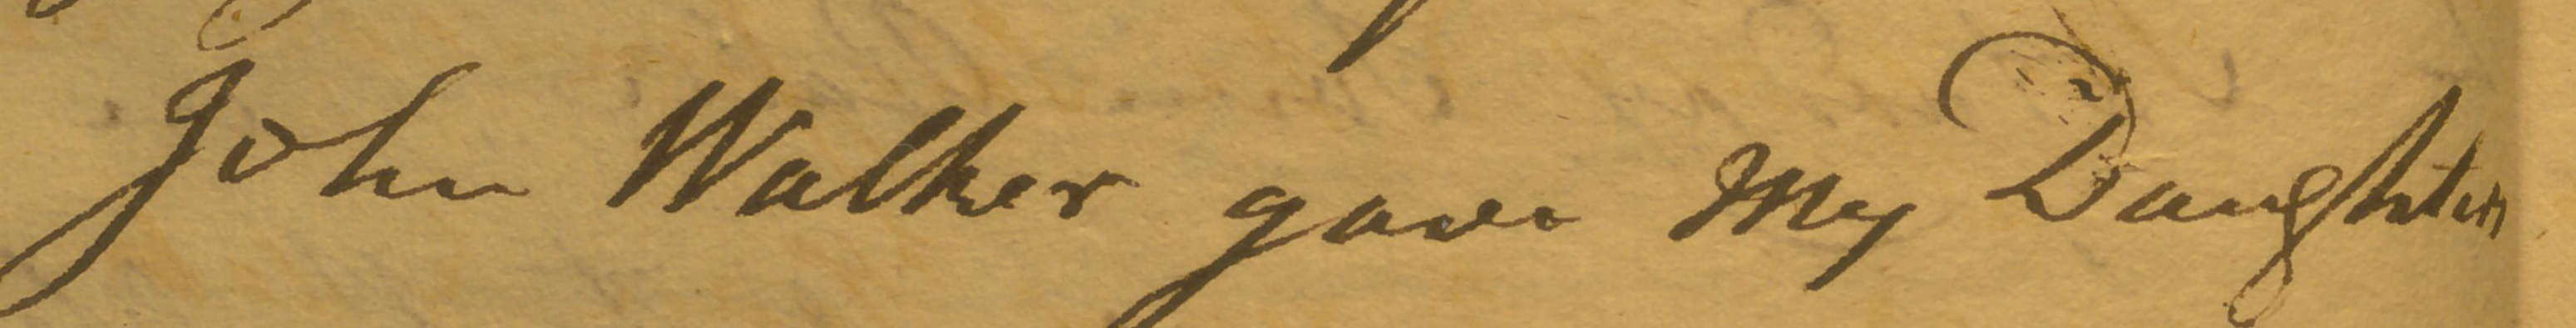John Walker gave My Daughter
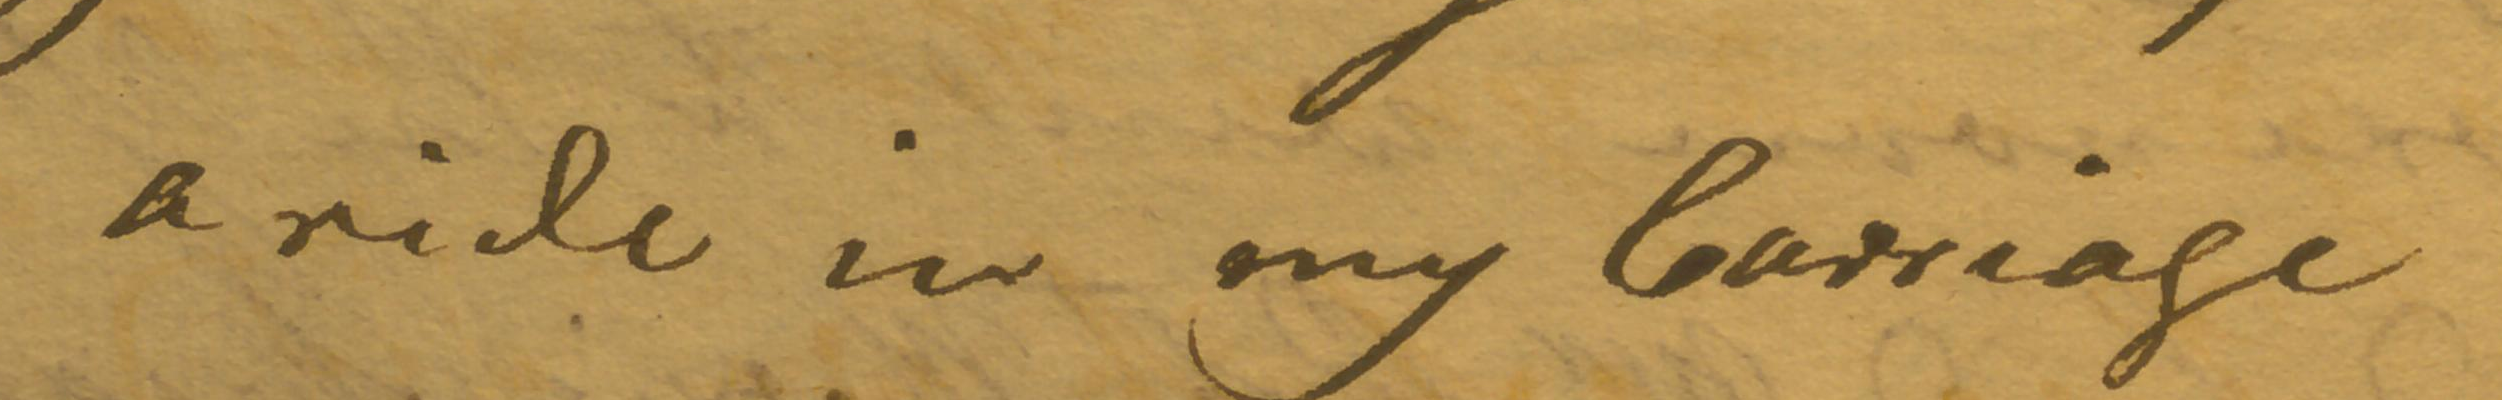a ride in my Carriage
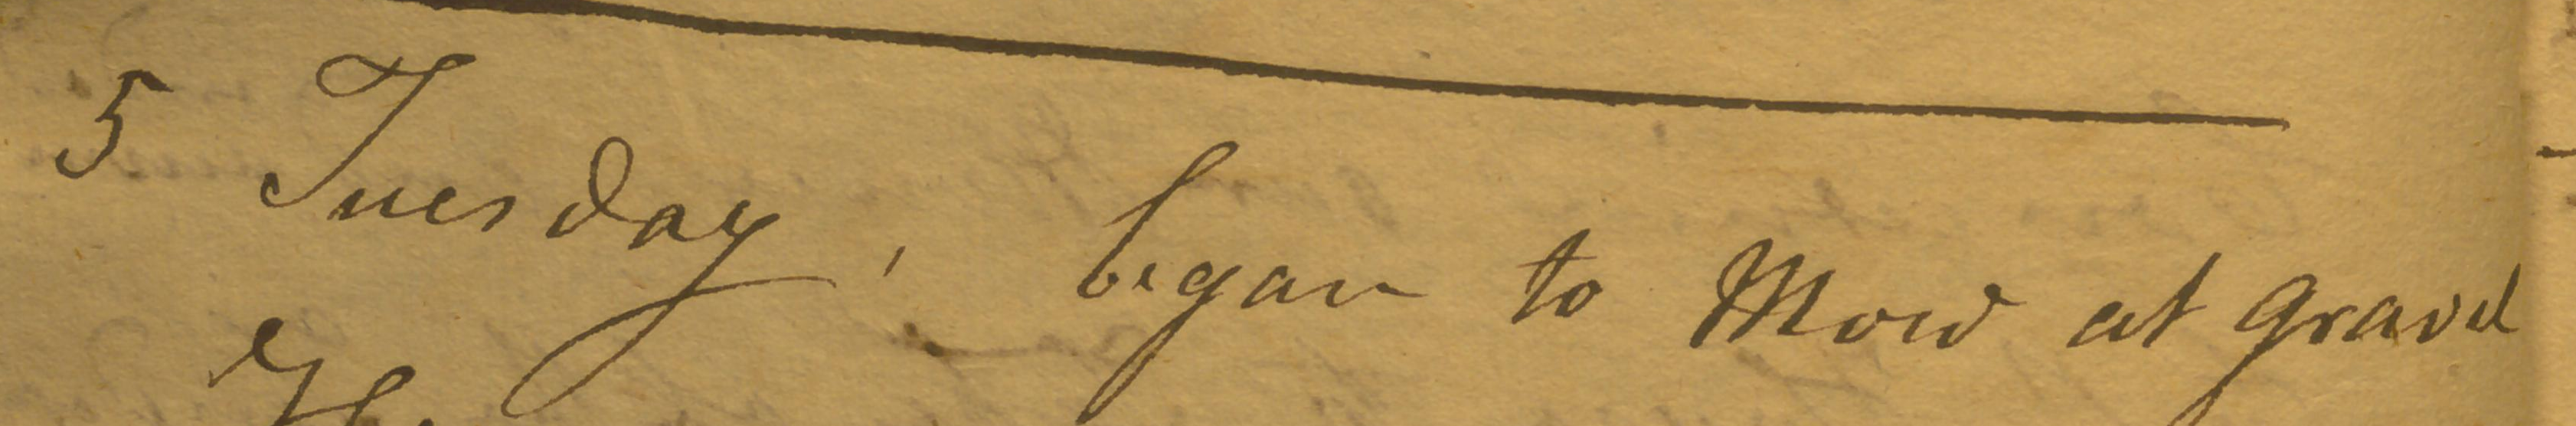5 Tuesday, began to Mow at Gravel
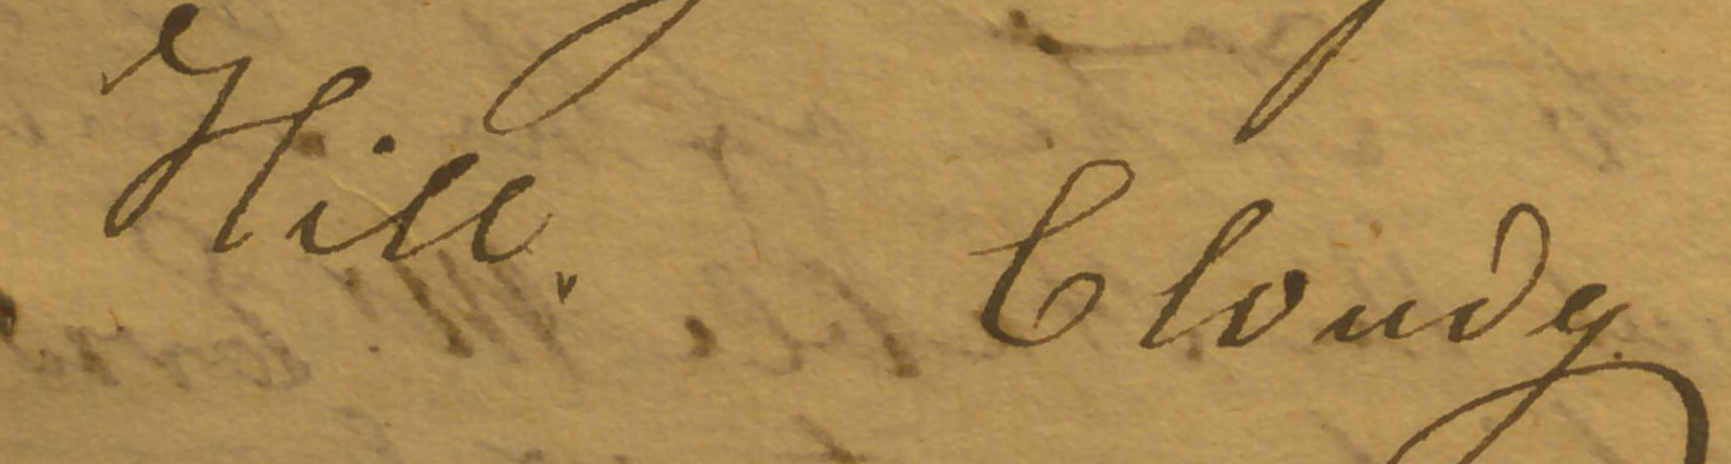Hill. Cloudy
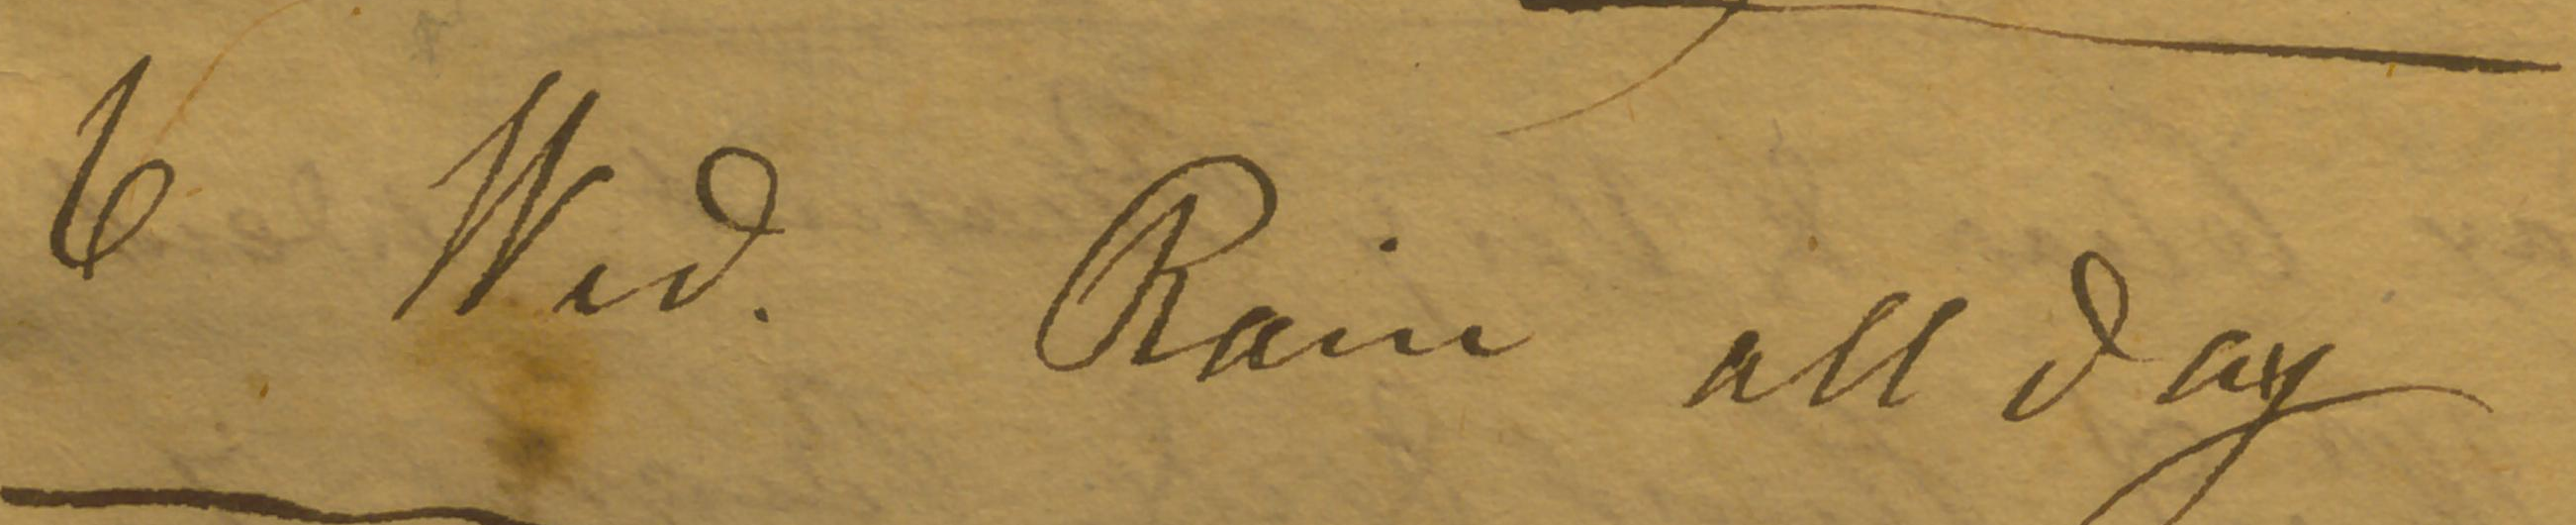6 Wed. Rain all day
